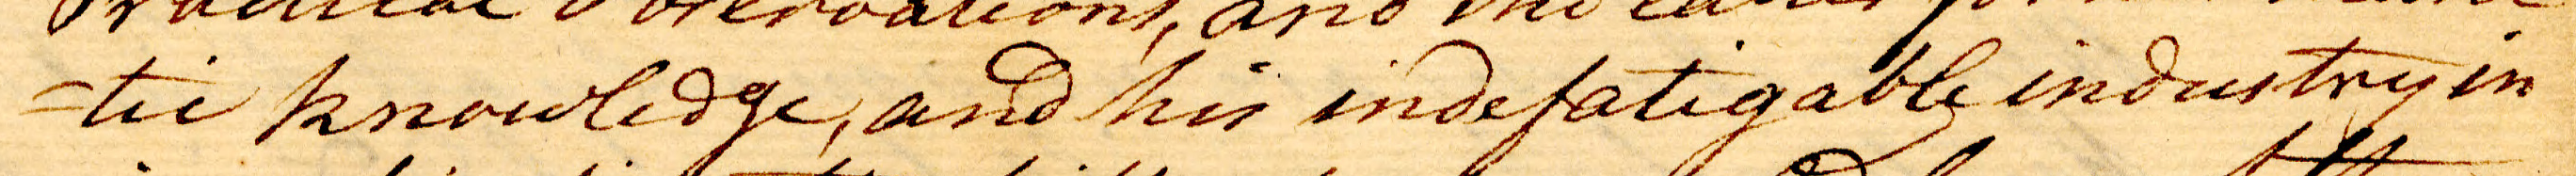-tic knowledge, and his indefatigable industry in
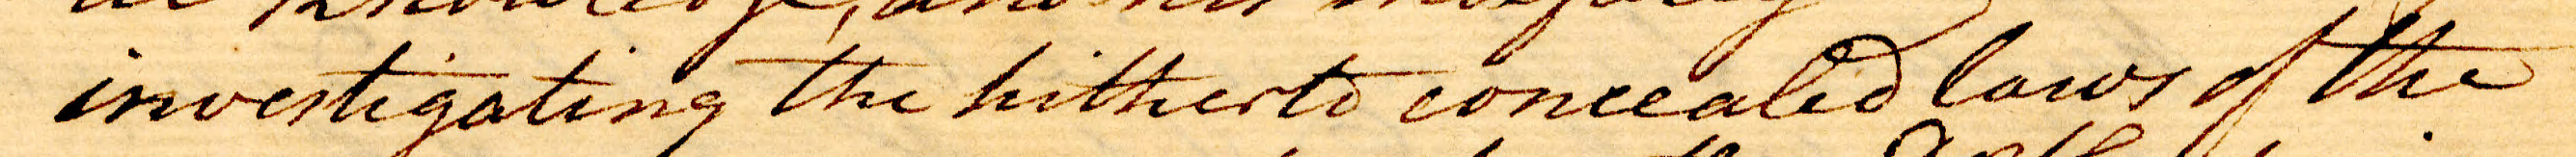investigating the hitherto concealed laws of the
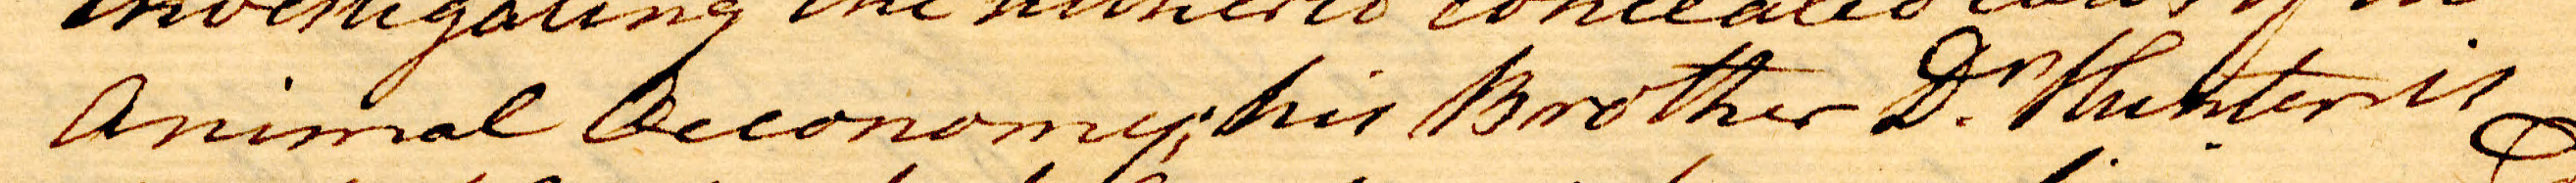Animal Oeconomy; his Brother D^r. Hunter is
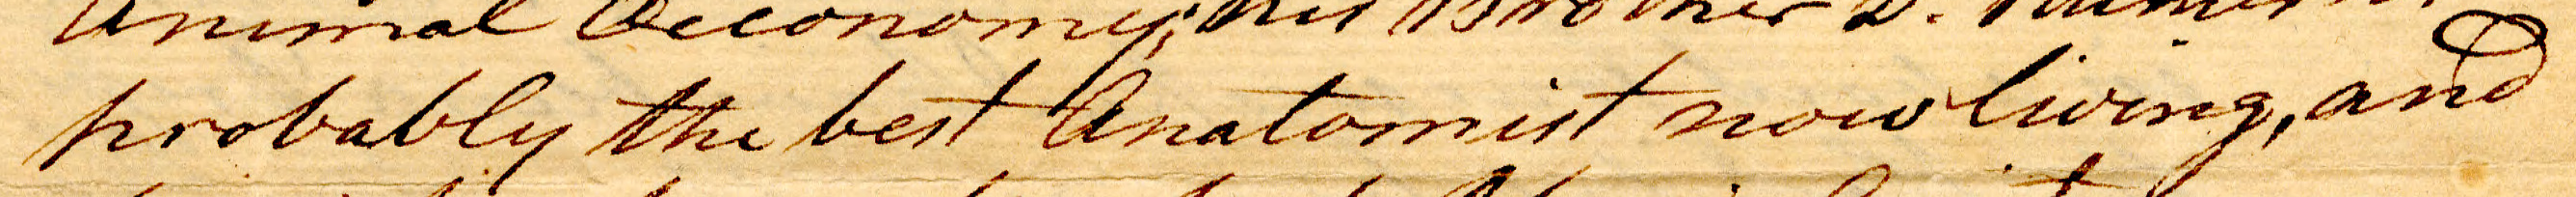probably the best Anatomist now living, and
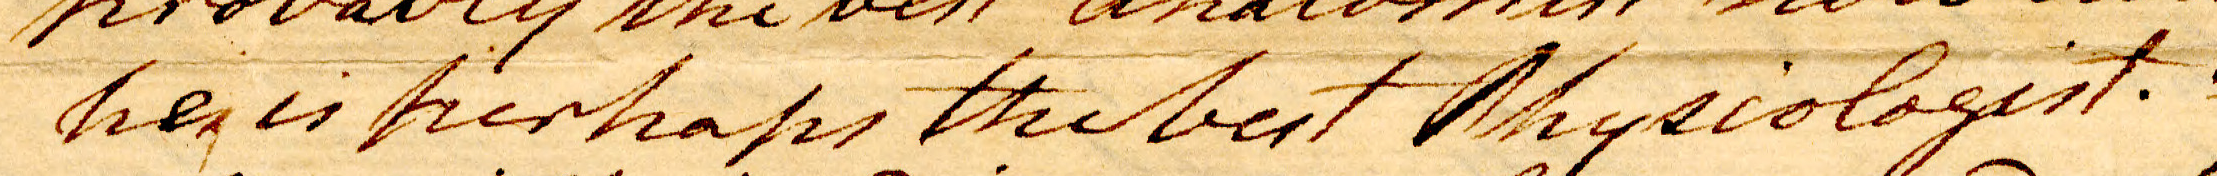he is perhaps the best Physiologist.
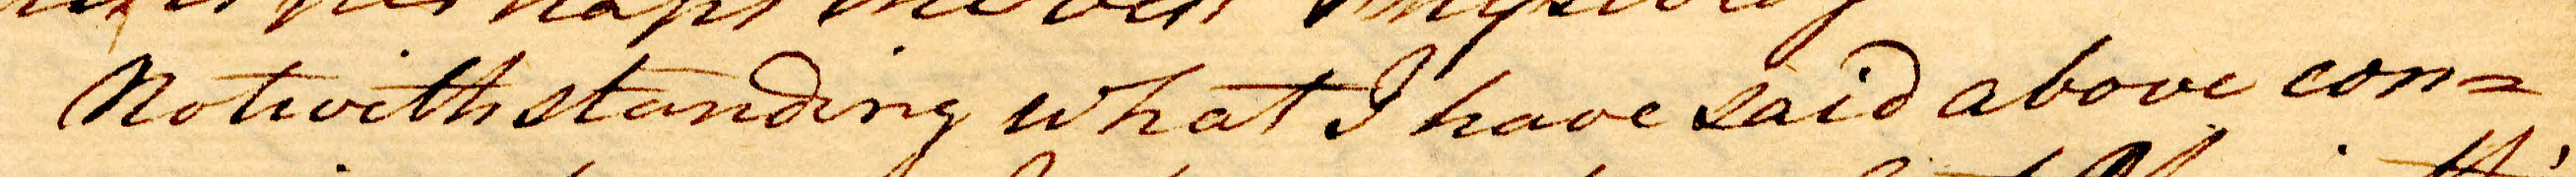Notwithstanding what I have said above con-
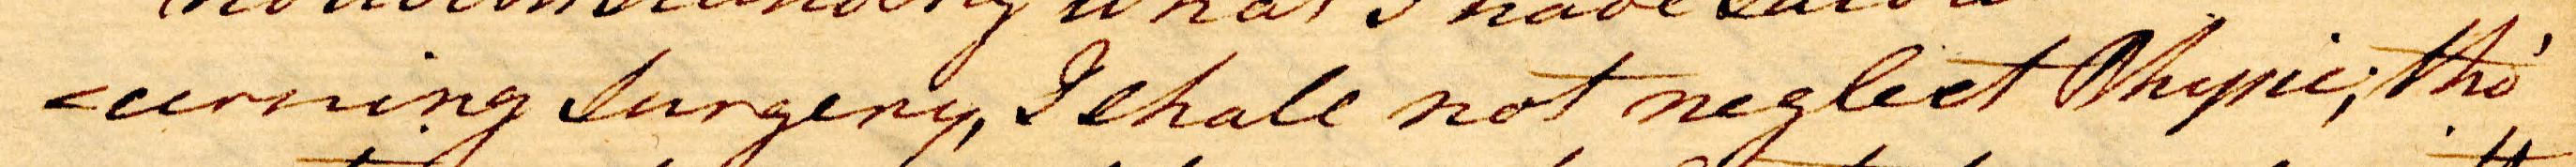-cerning Surgery, I shall not neglect Physic; tho'
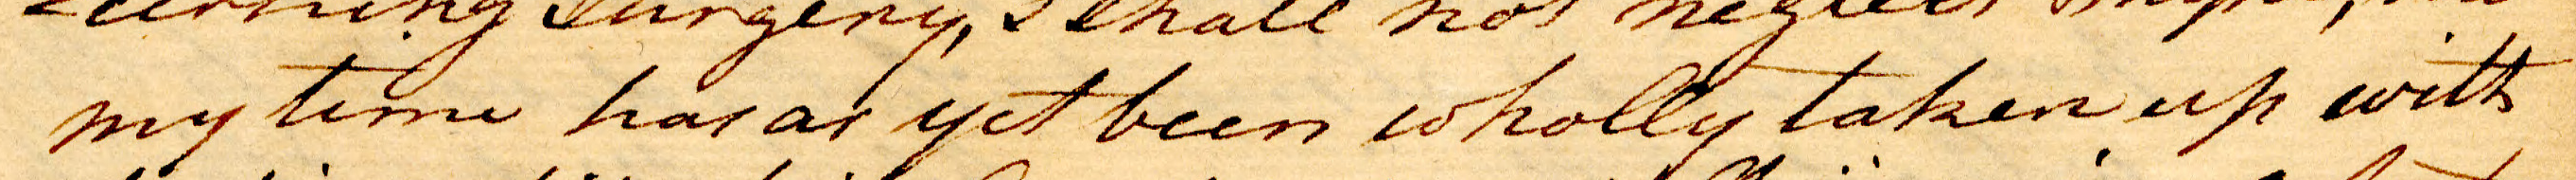my time has as yet been wholly taken up with
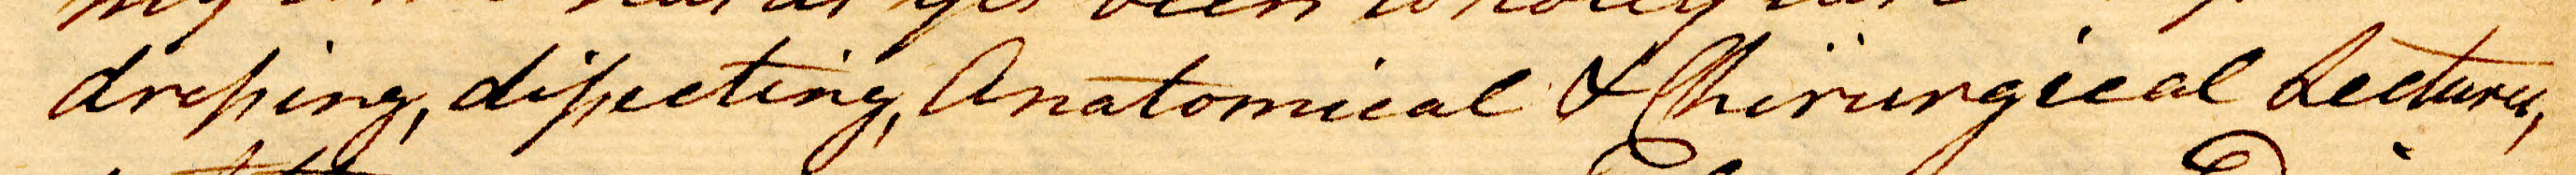dressing, dissecting, Anatomical & Chirurgical Lectures,
